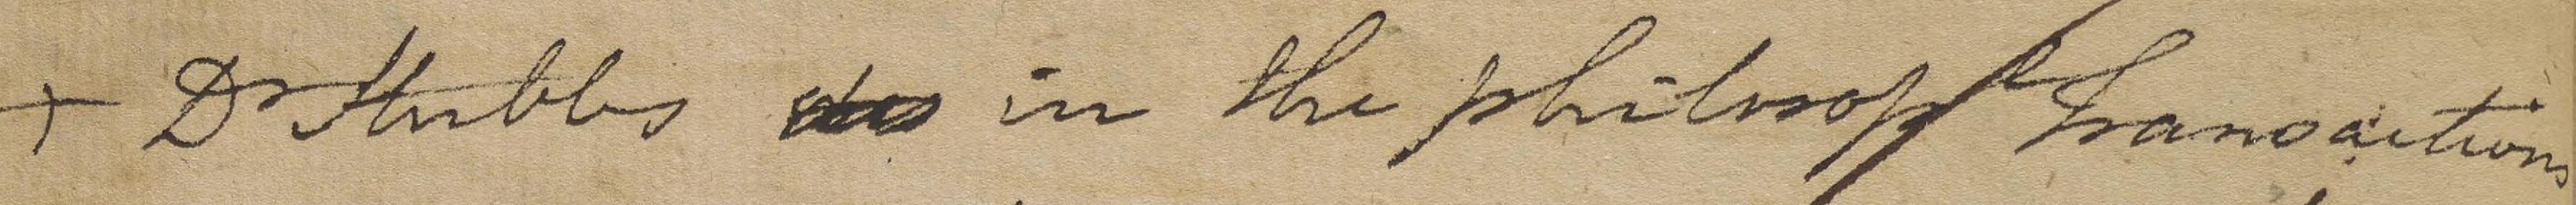+ D^r Hubbs [__] in the philosoph^l Transactions
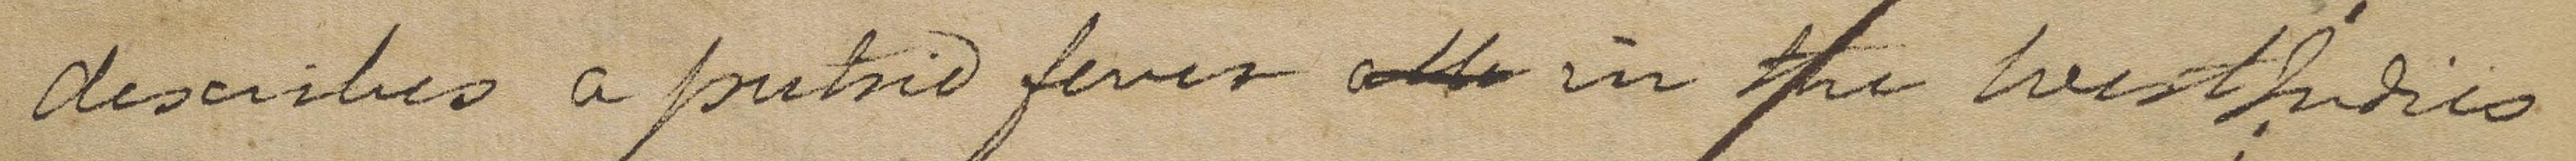describes a putrid fever [all] in the West Indies
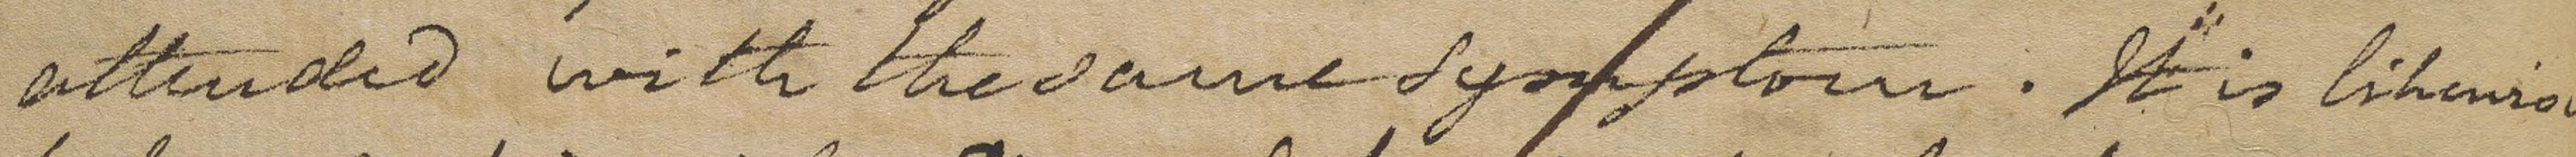attended with the same symptom. It is likewise
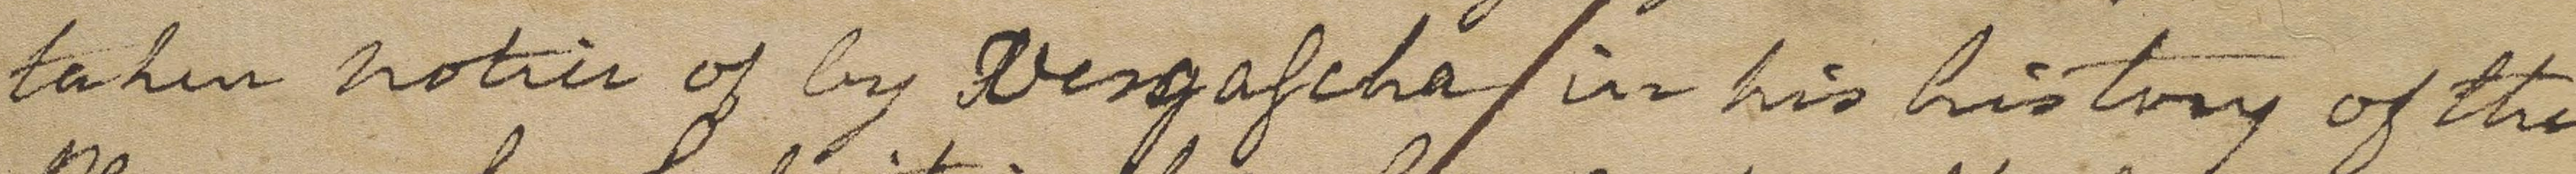taken notris of by Vengascha in his history of the
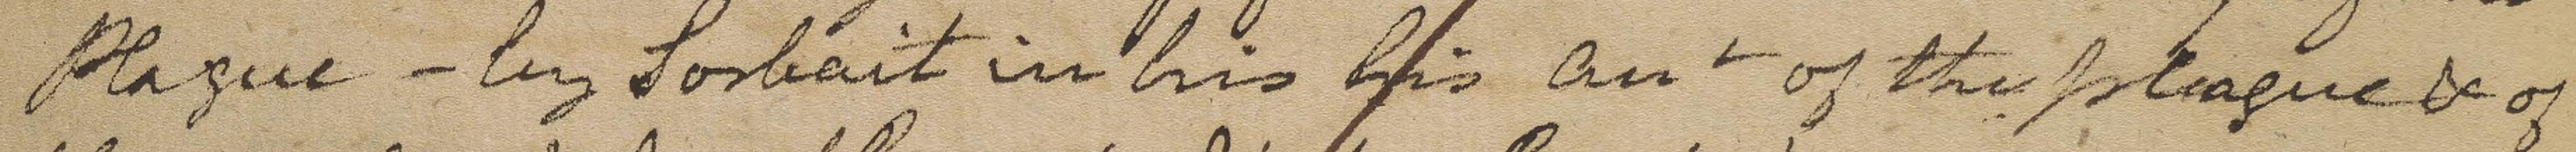Plague- by Sorbait in his Air^t of the plague & of
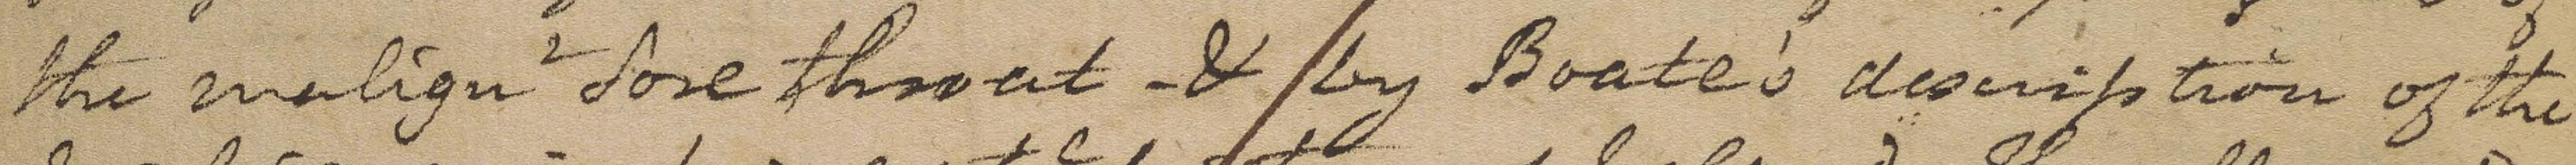the malign^t Sore throat, & by Boate's description of the
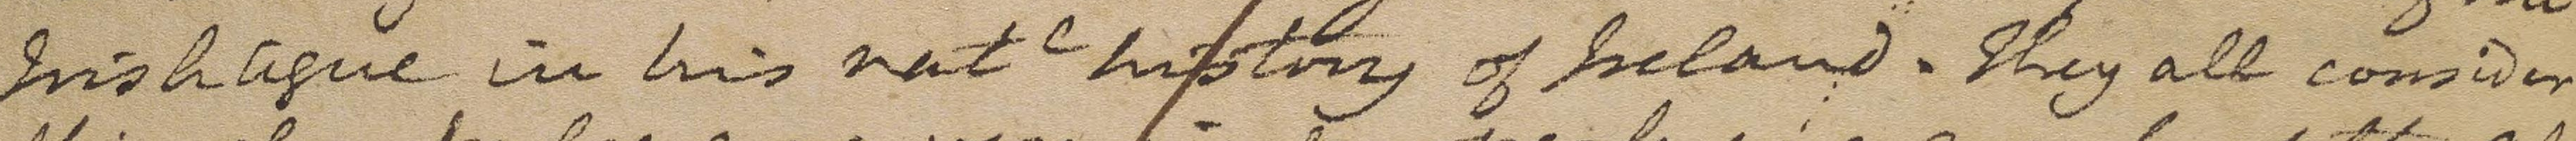Irish ague in his nat^l history of Ireland. They all consider
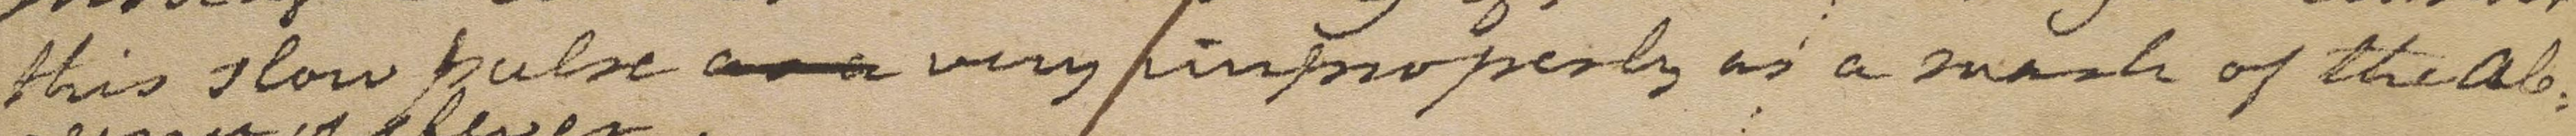this slow pulse very improperly as a mask of the ab-
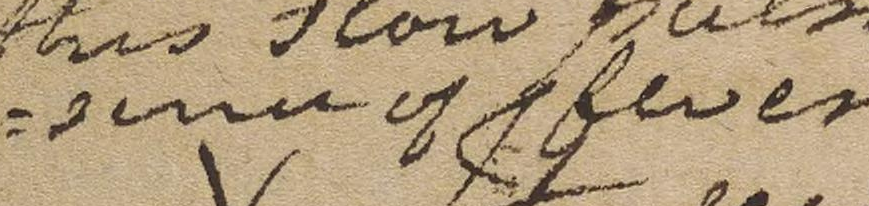sence of fever.
